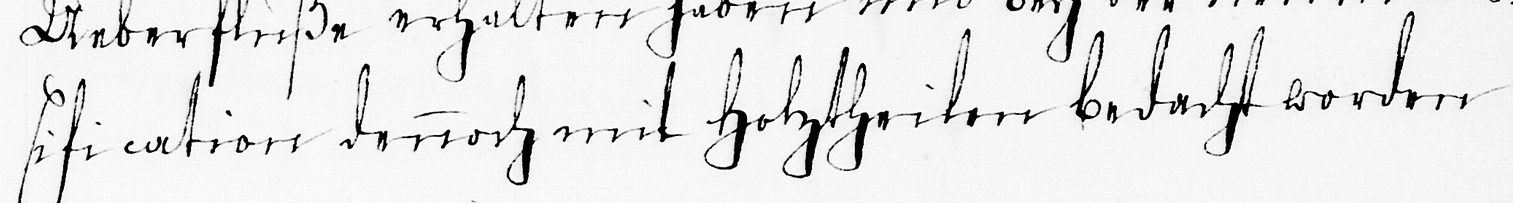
ification dennoch mit Holztheilen bedacht worden
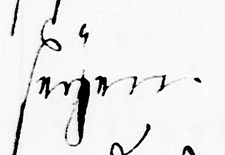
seyen.
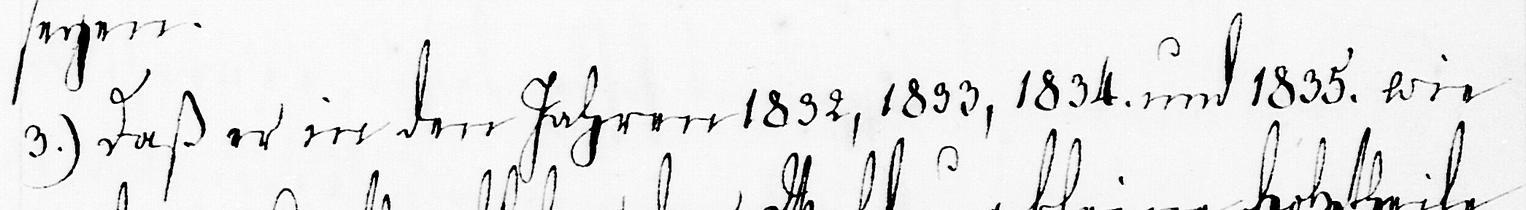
3.) Daß er in den Jahren 1832, 1833, 1834. und 1835. wie
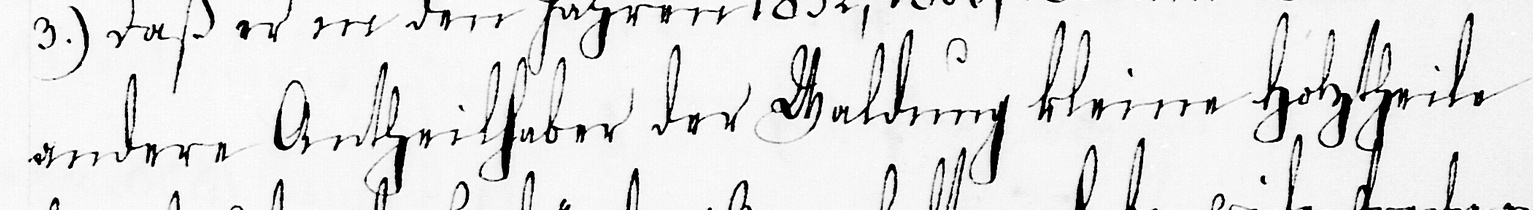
andere Antheilhaber der Waldung kleine Holztheile
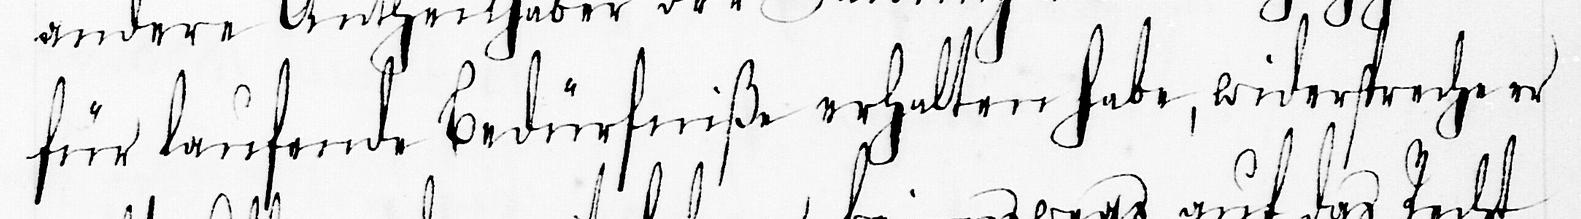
für laufende Bedürfniße erhalten habe, widerspreche er
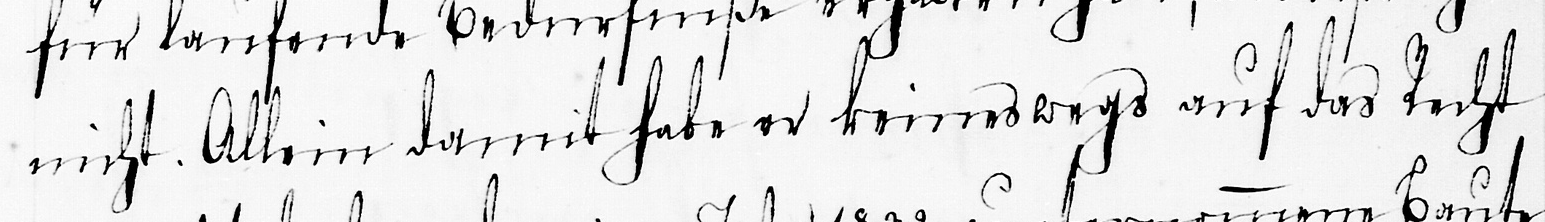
nicht. Allein damit habe er keineswegs auf das Recht
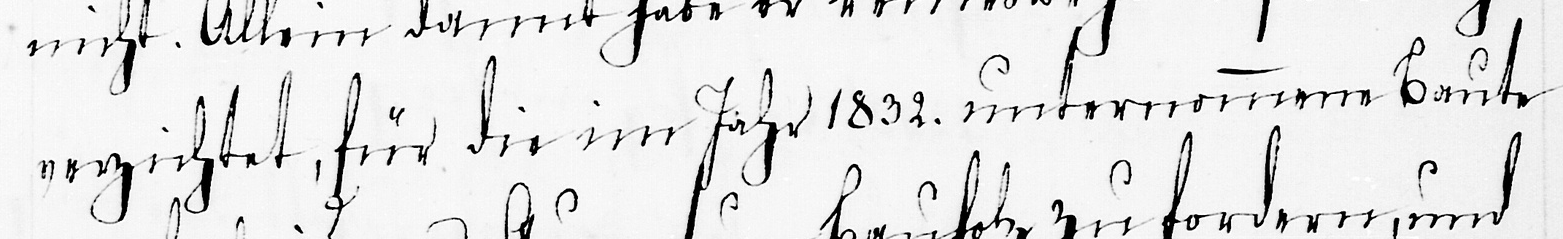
verzichtet, für die im Jahr 1832. unternommene Baute
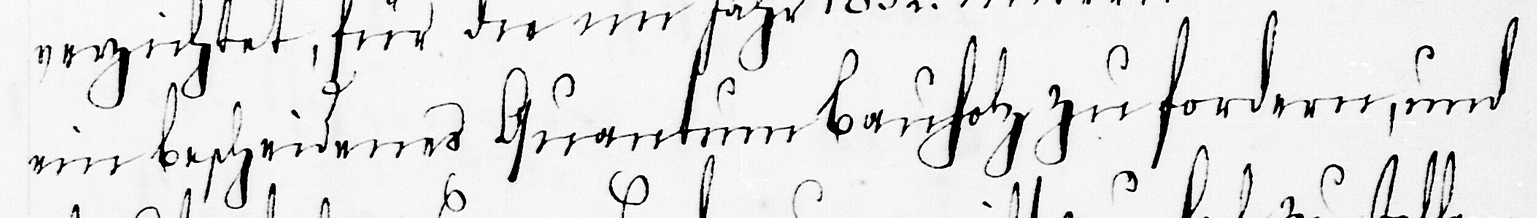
ein bescheidenes Quantum Bauholz zu fordern, und
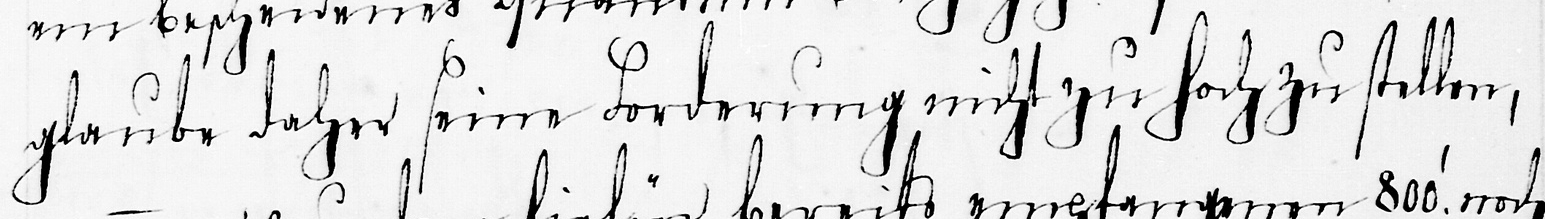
glaube daher seine Forderung nicht zu hoch zu stellen,
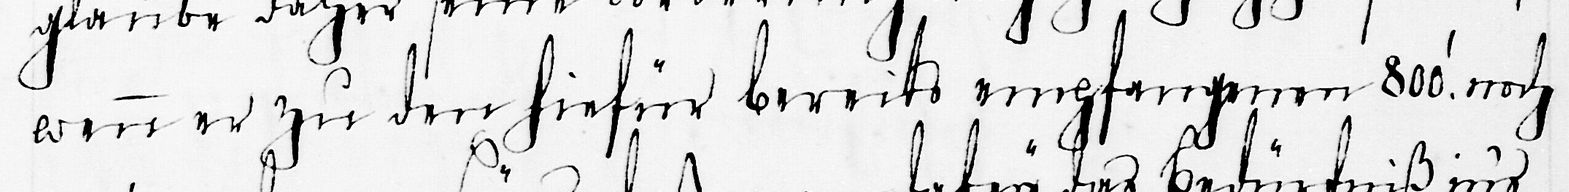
wenn er zu den hiefür bereits empfangenen 800‘. noch
